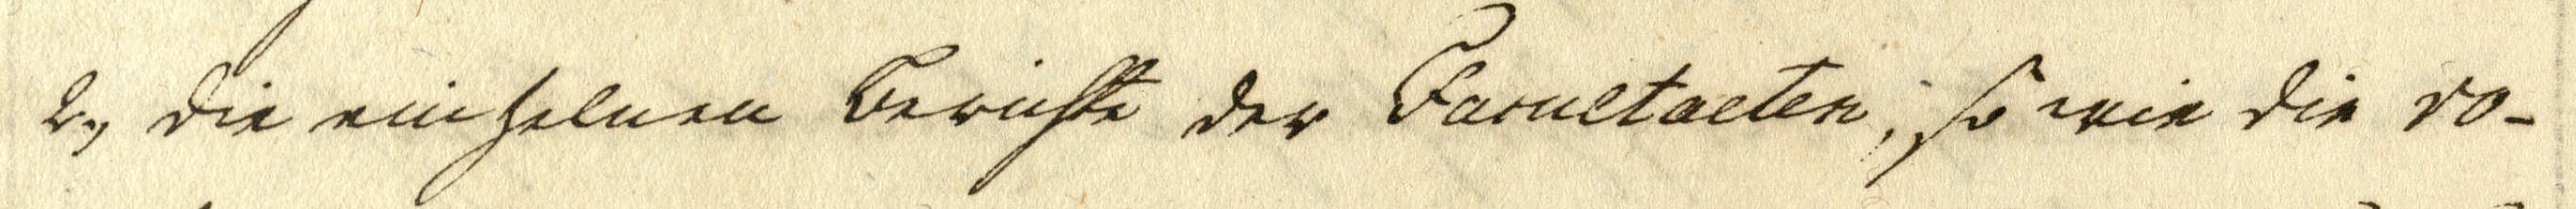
2.) die einzelnen Berichte der Facultaeten, so wie die ro-
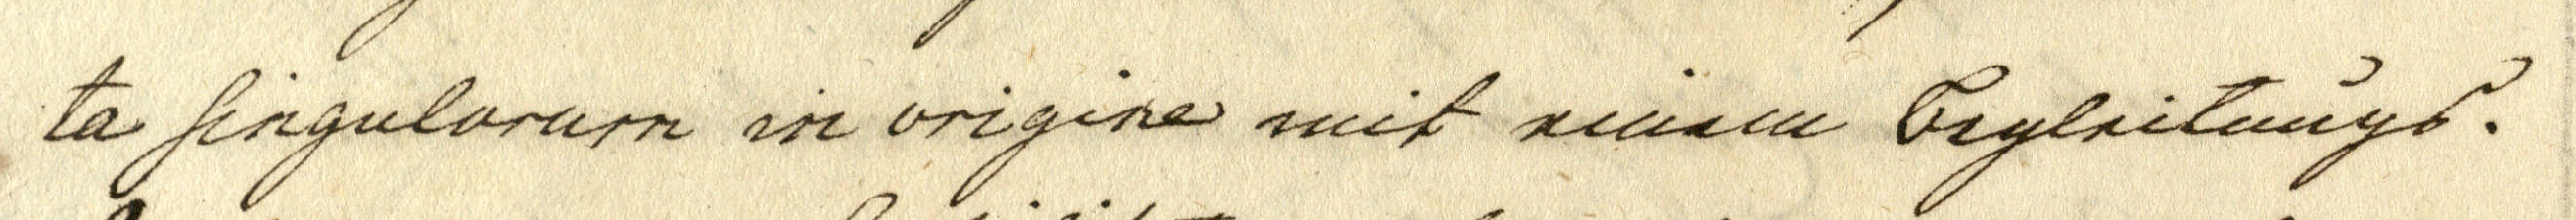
ta singularum in origine mit einem Begleitungs-
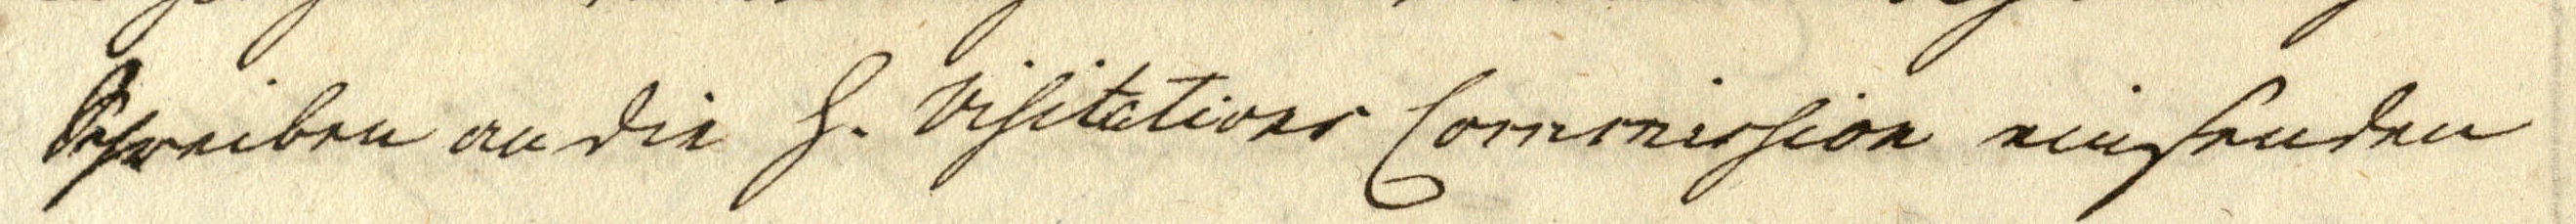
Schreiben an die h. Visitations Commission einsenden
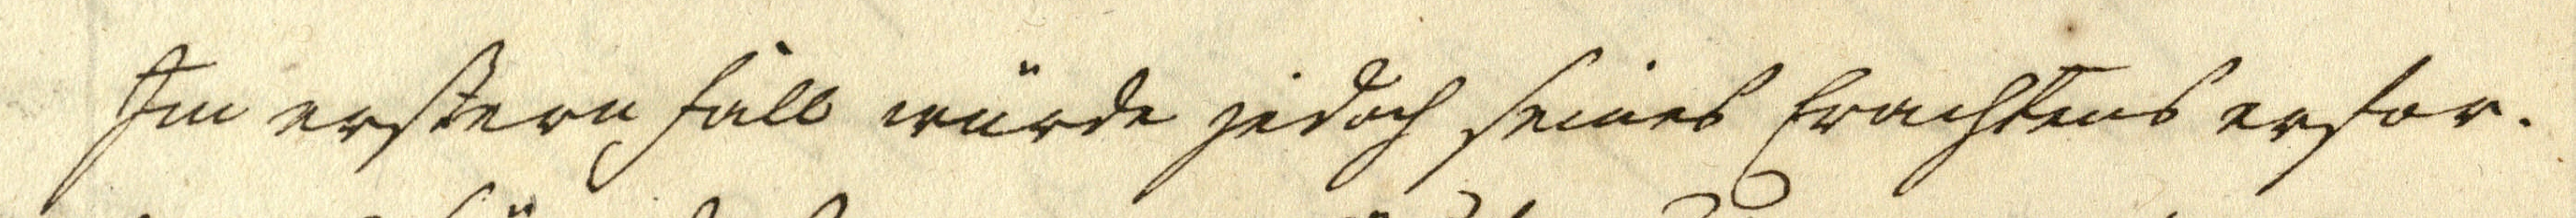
Im erstern Fall würde jedoch seines Erachtens erfor-
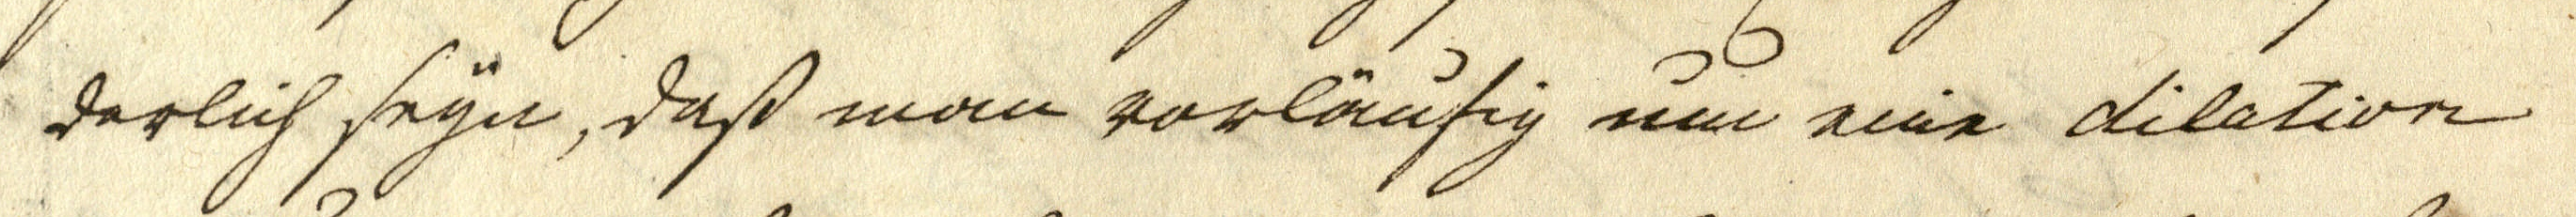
derlich seyn, daß man vorläufig um eine dilation
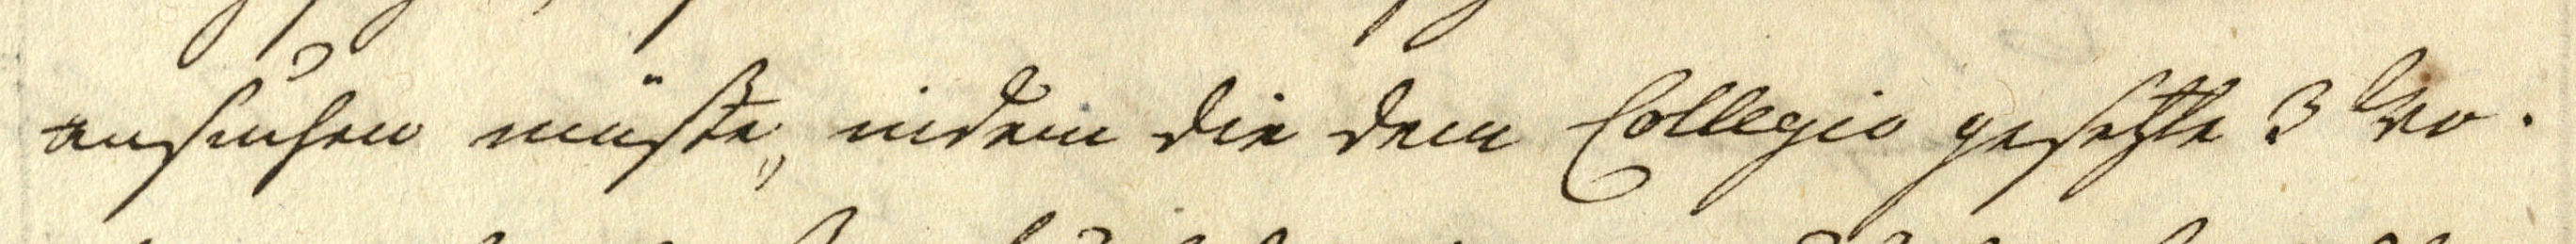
ansuchen müßte, indem die dem Collegio gesetzte 3 Wo-
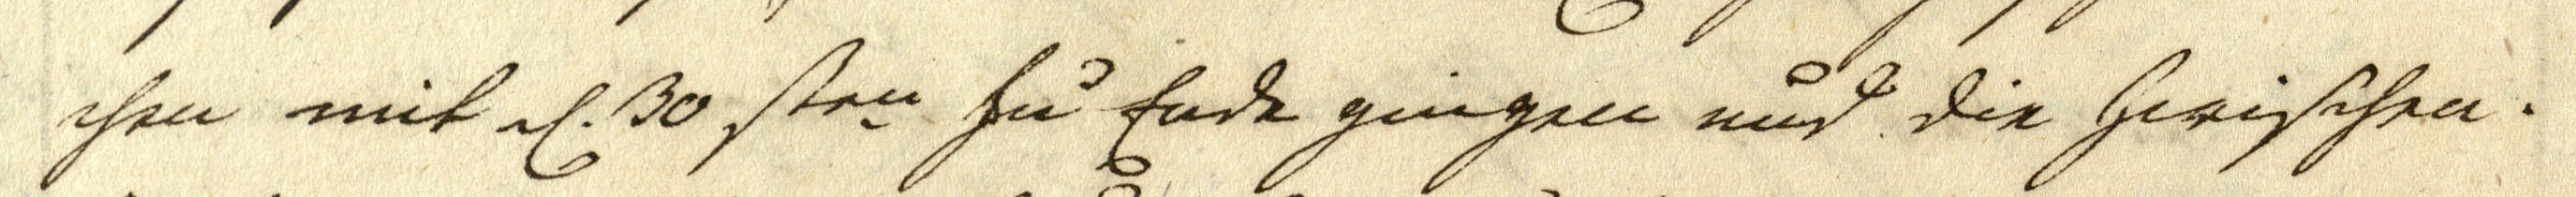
chen mit d. 30sten zu Ende gingen und die Zwischen-
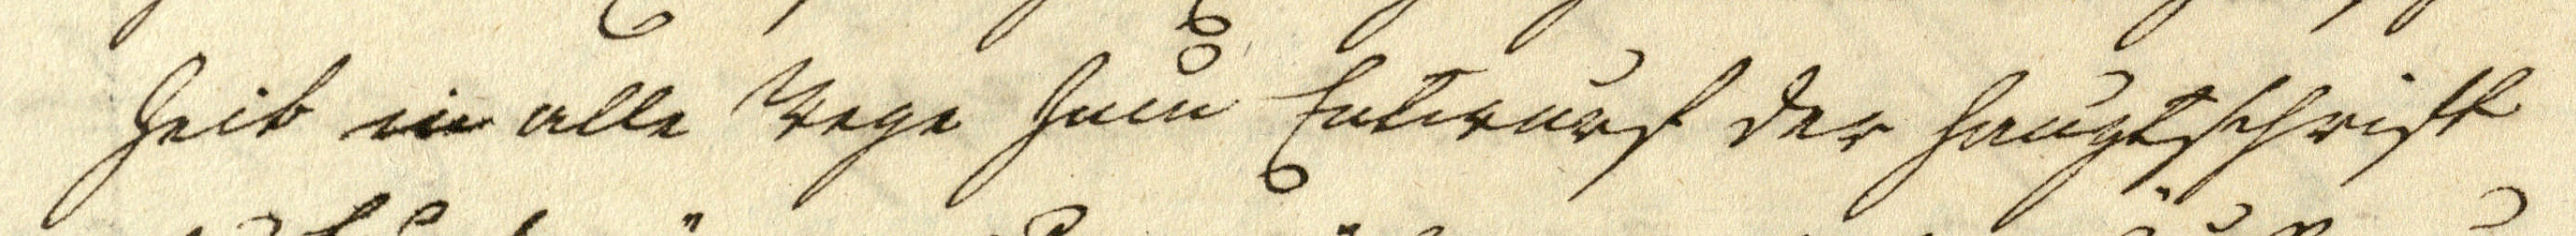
Zeit in alle Wege zum Entwurf der Hauptschrift
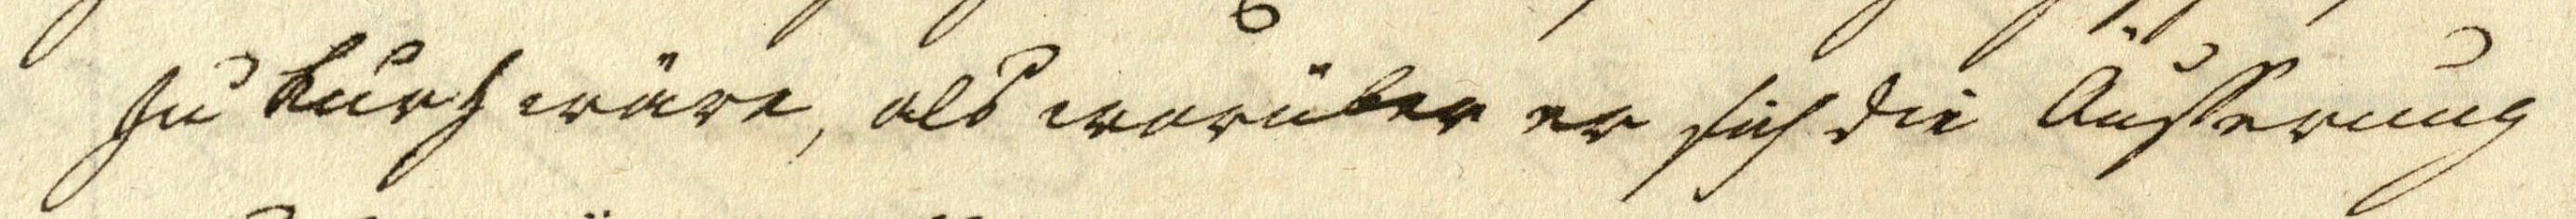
zu kurz wäre, als worüber er sich die Äusserung
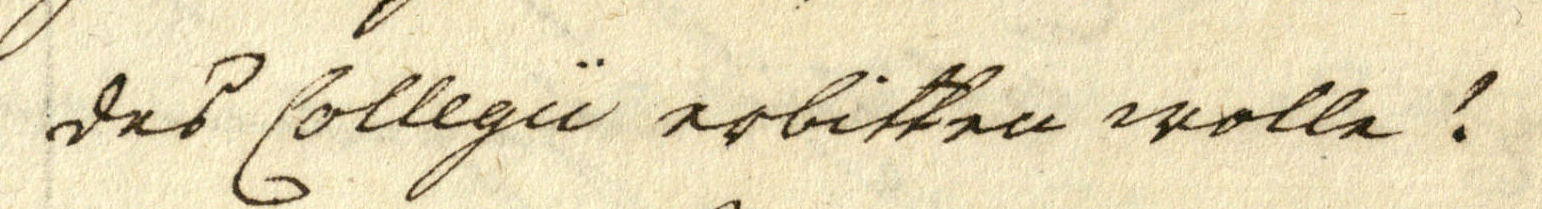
des Collegii erbitten wolle?
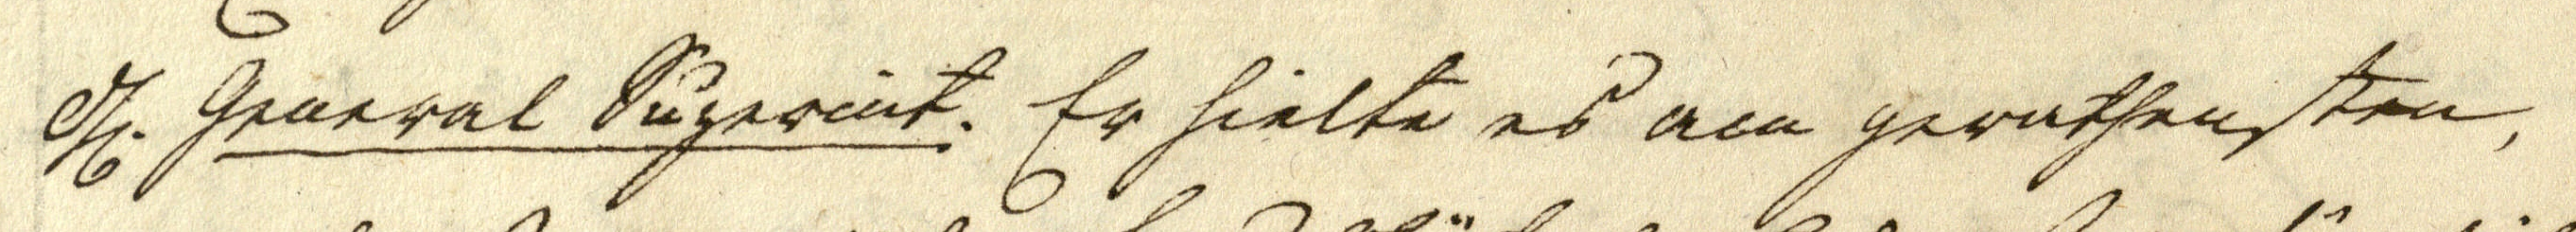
dh. General Superint. Er hielte es am gerathensten,
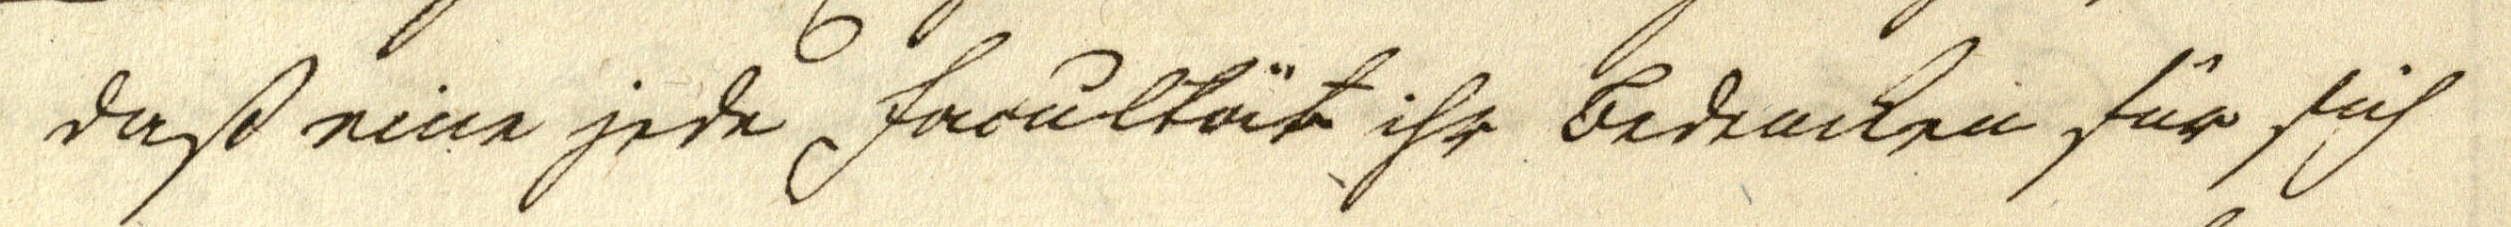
daß eine jede Facultät ihr Bedenken für scih
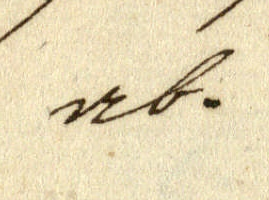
ab-
